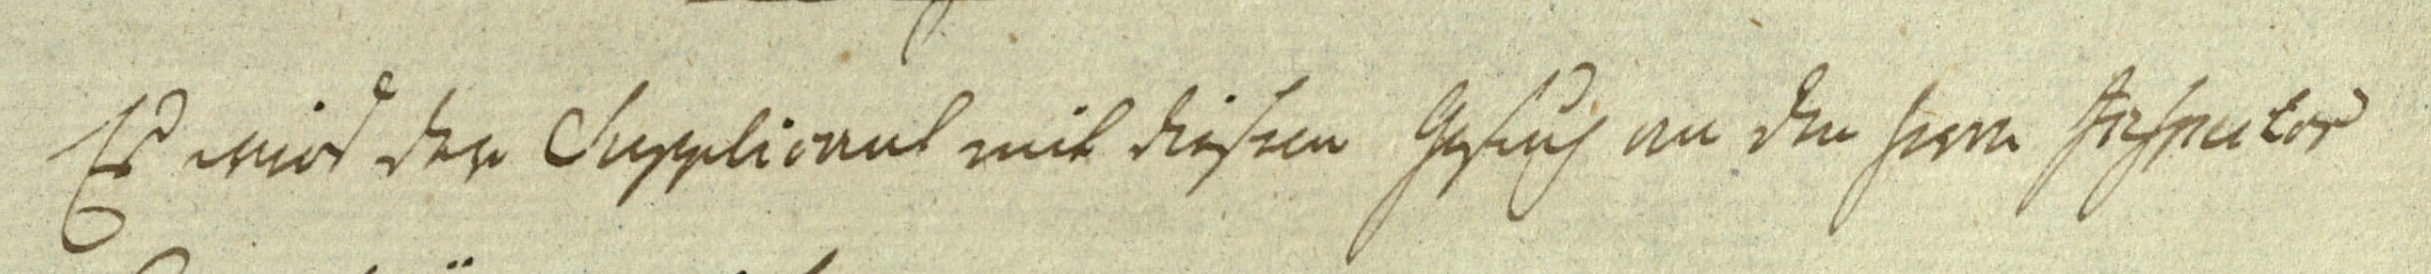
Es wird der Supplicant mit diesem Gesuch an den Herrn Inspector
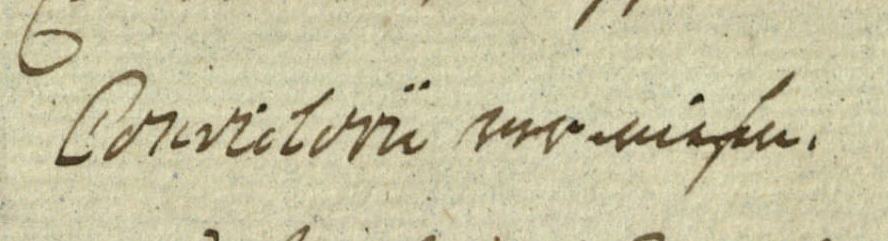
Convictorii verwiesen.
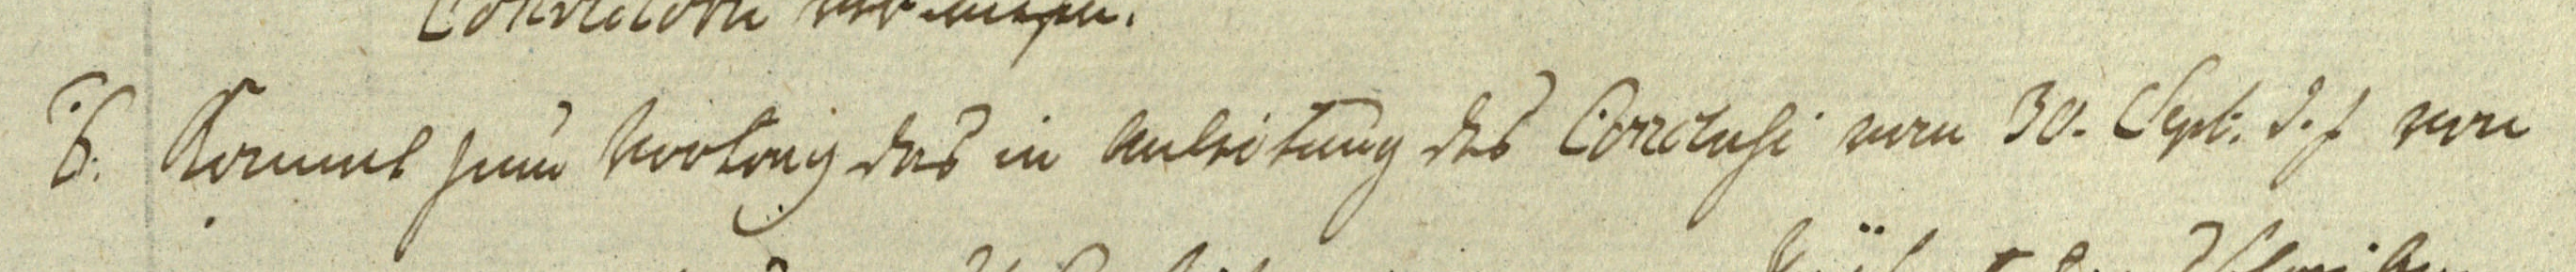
6. Kommt zum Vortrag das in Anleitung des Conclusi vom 30. Sept. d. J. von
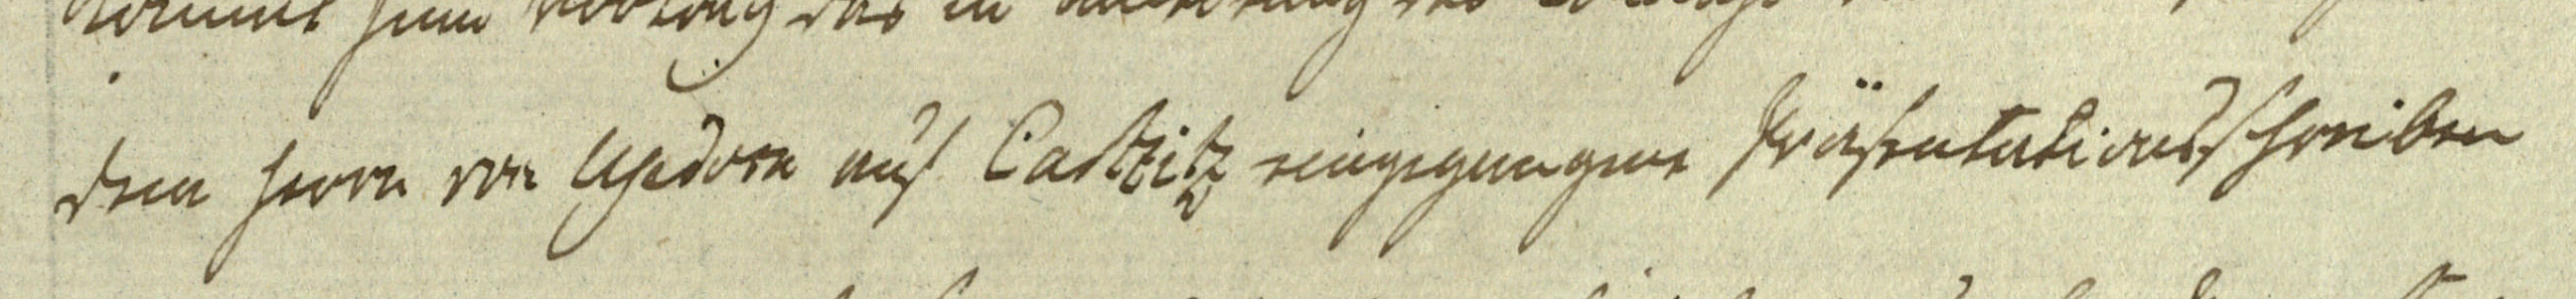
dem Herrn von Usedom auf Cartzitz eingegangene Präsentationschreiben
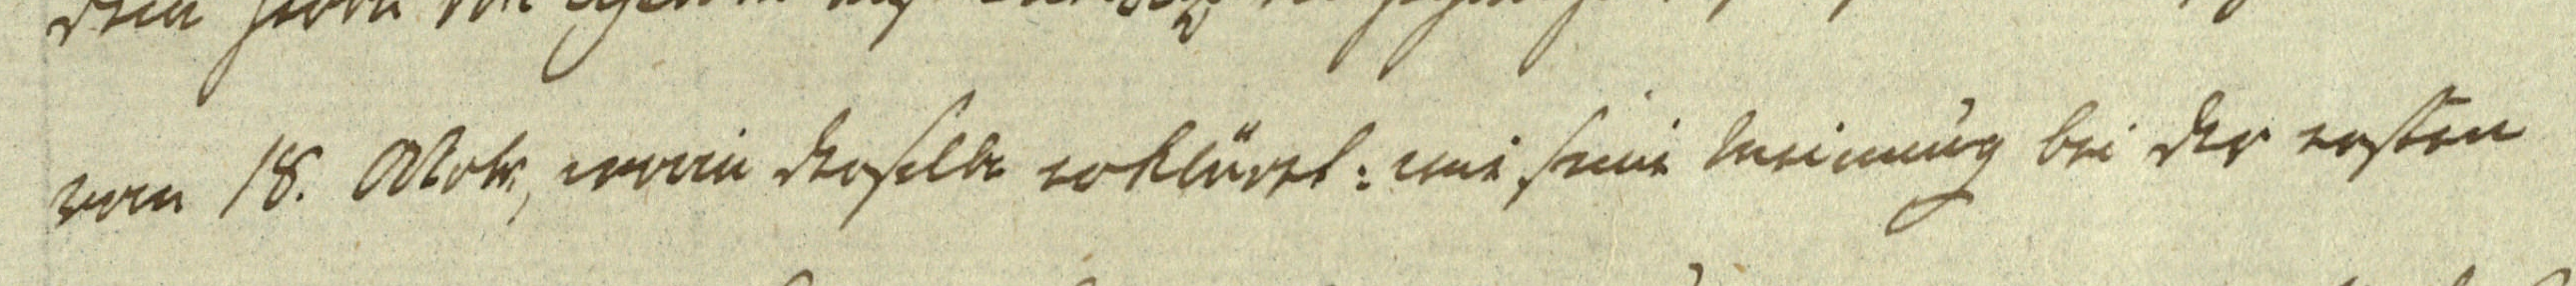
vom 18. Octobr., worin derselbe erkläret: wie seine Meinung bei der ersten
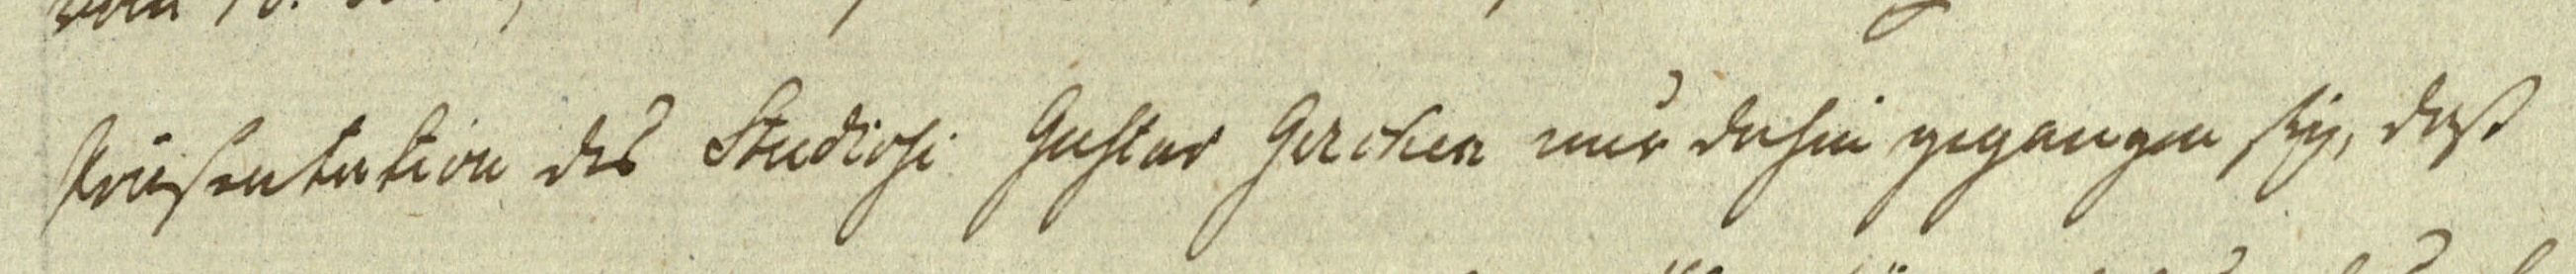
Präsentation des Studiosi Gustav Gercken nur dahin gegangen seÿ, daß
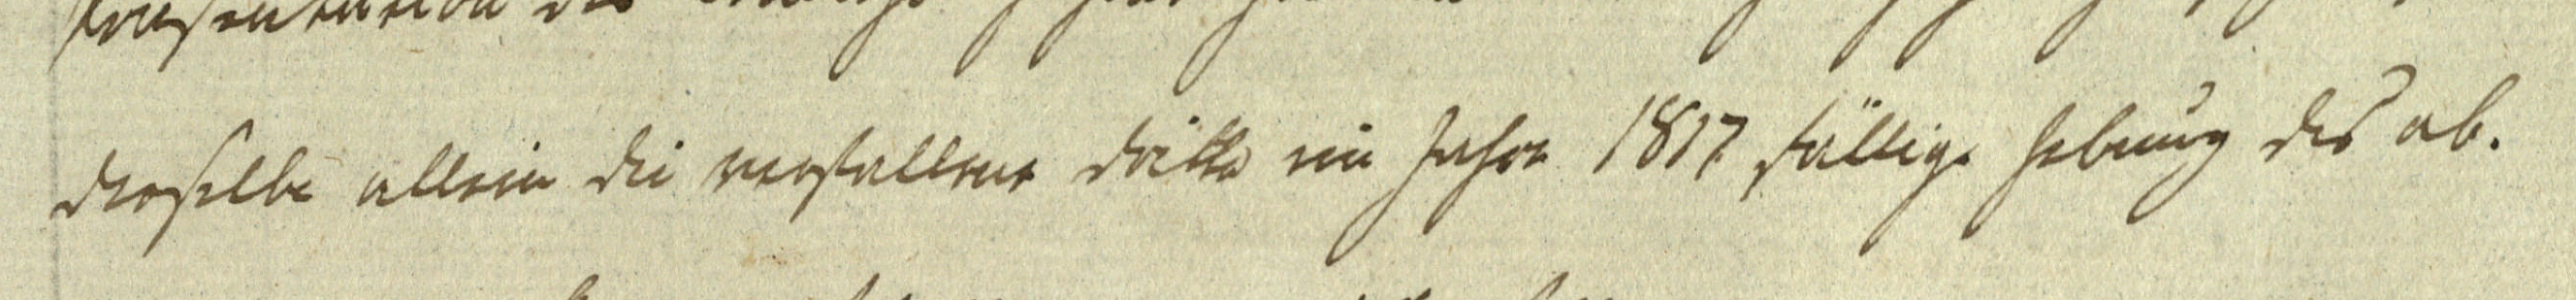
derselbe allein die verfallene dritte im Jahre 1817 fällige Hebung des ab¬
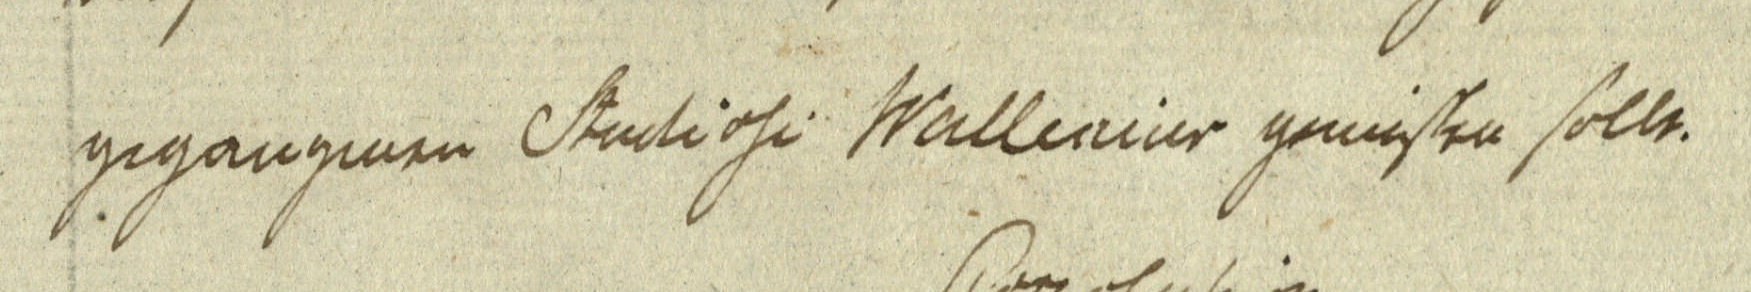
gegangenen Studiosi Wallenius geniessen solle.
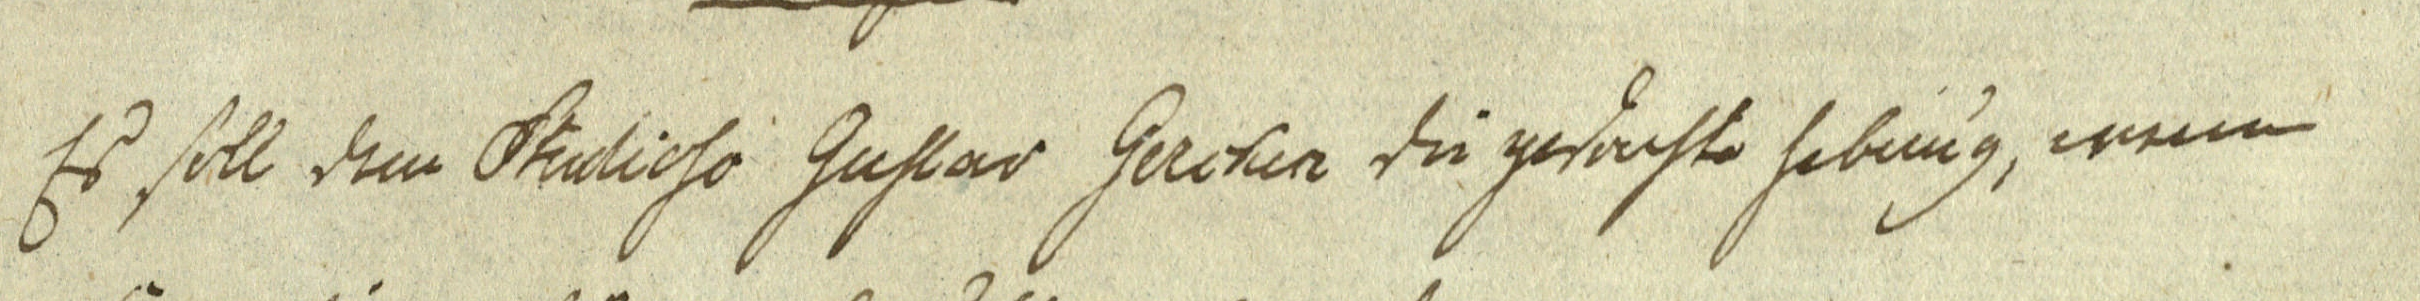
Es soll dem Studioso Gustav Gercken die gedachte Hebung, wenn
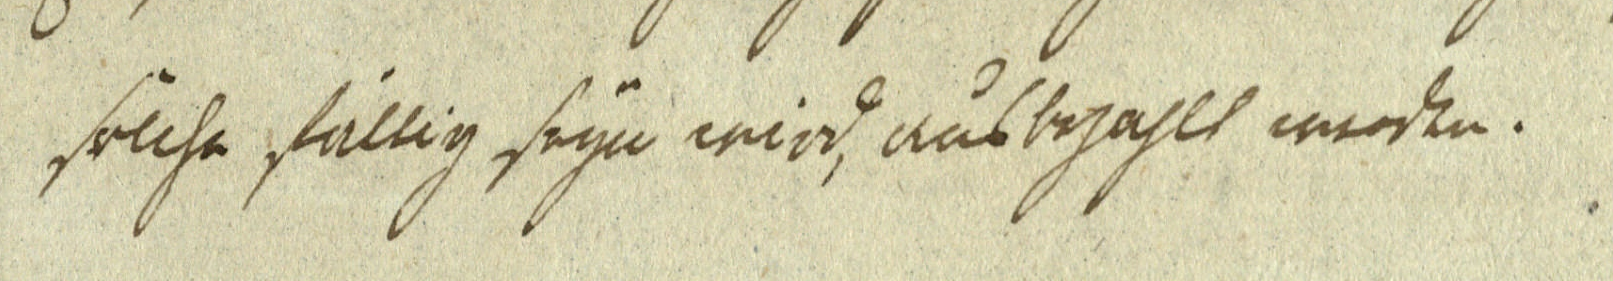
solche fällig seÿn wird, ausbezahlt werden.
